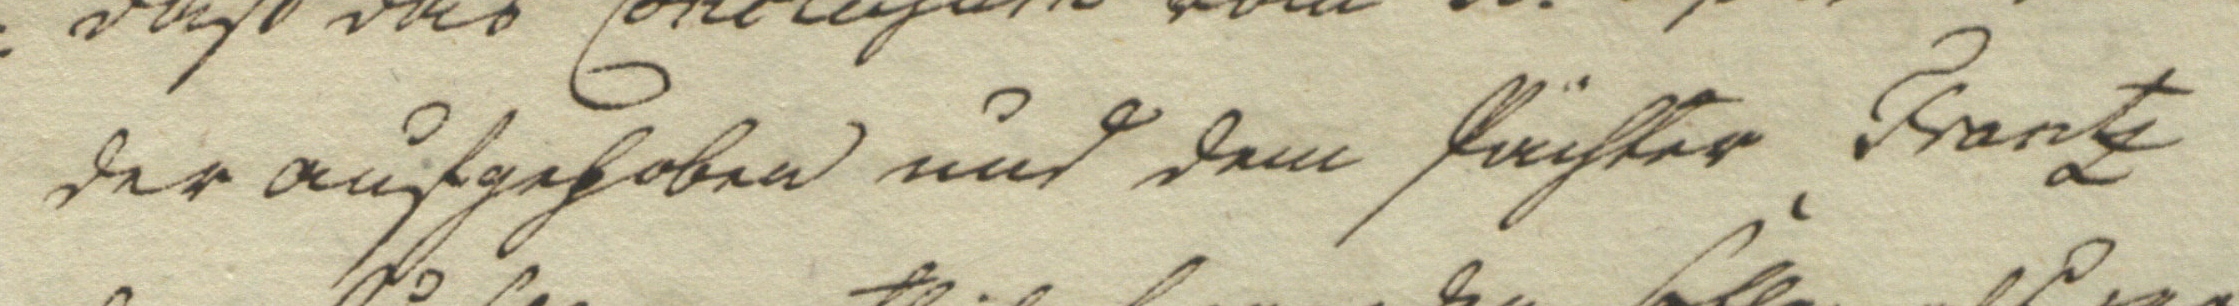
der aufgehoben und dem Pächter Frantz
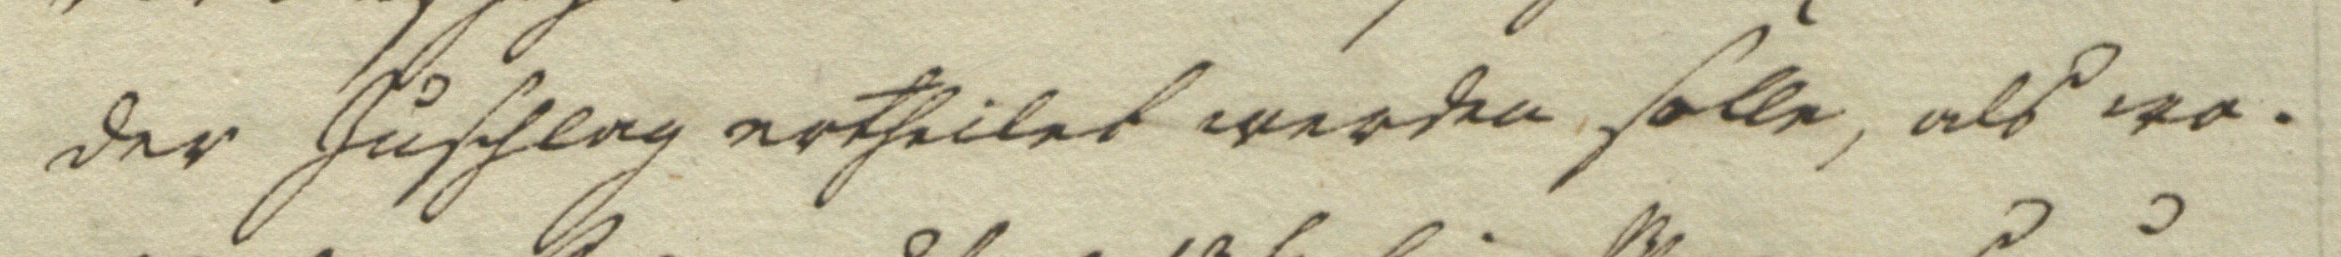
der Zuschlag ertheilet werden solle, als wo¬
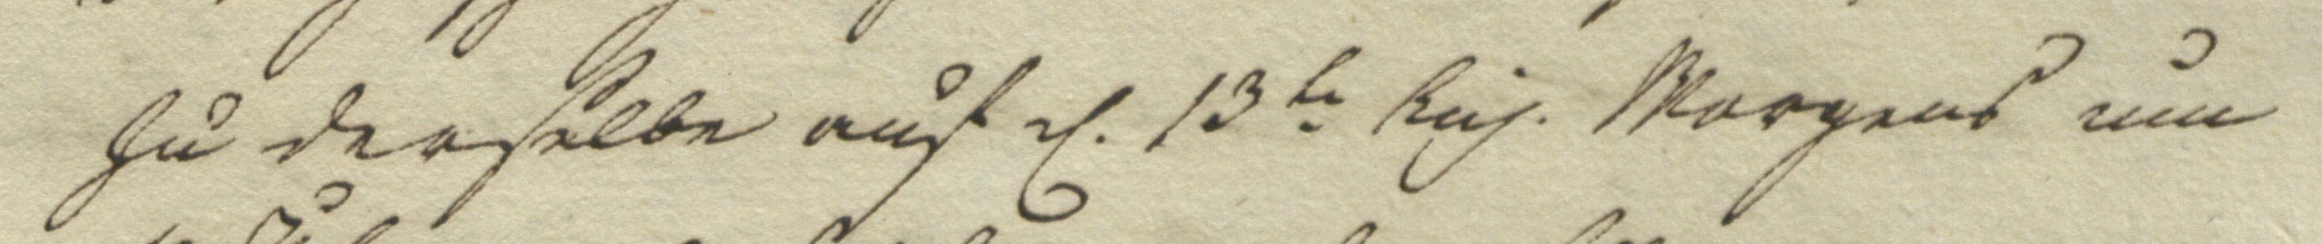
zu derselbe auf d. 13 te huj. Morgens um
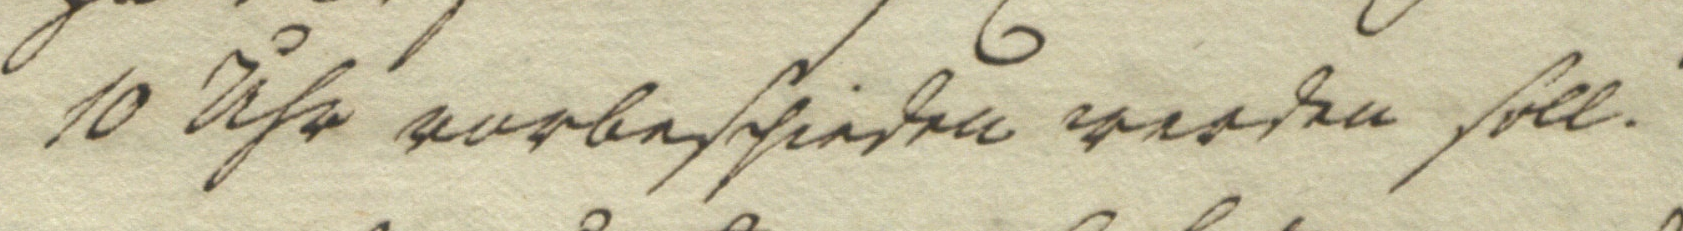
10 Uhr vorbeschieden werden soll.
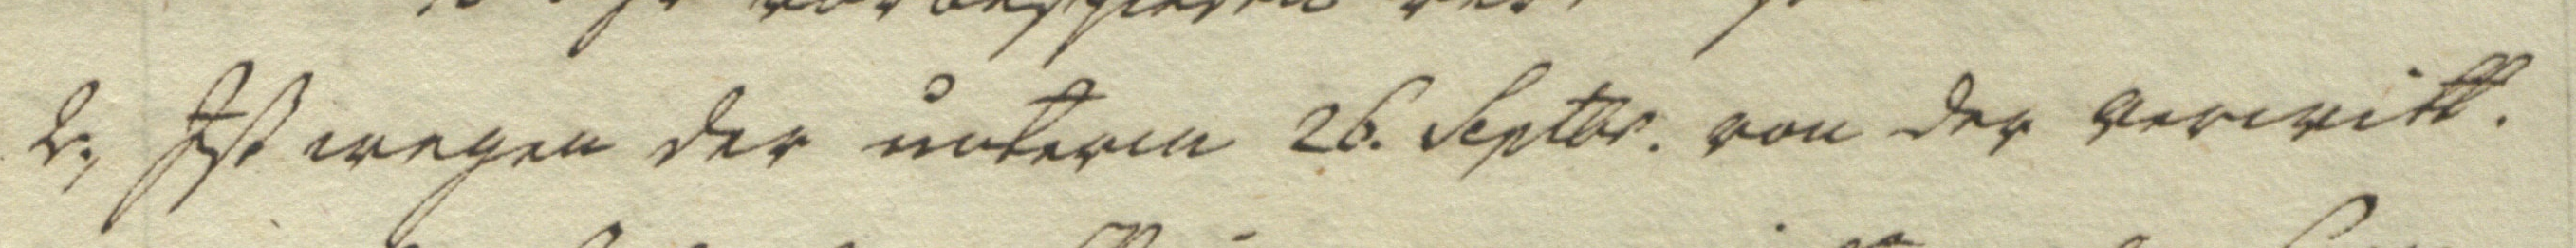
2., Ist wegen der unterm 26. Septbr. von der verwitt¬
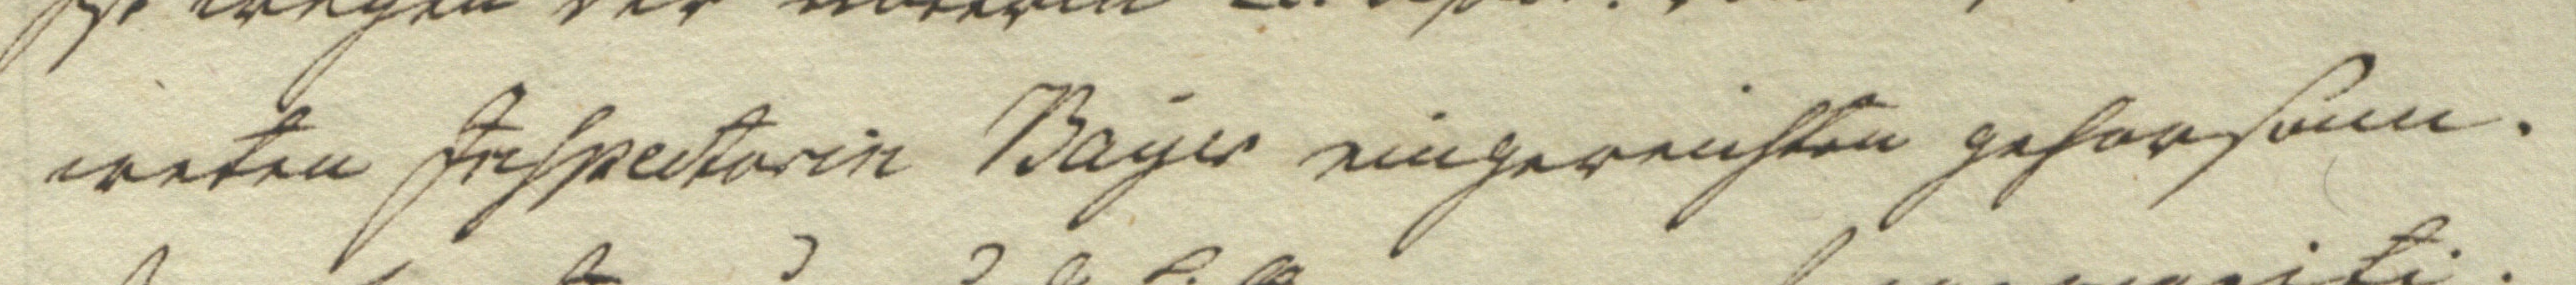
weten Inspectorin Baÿer eingereichten gehorsam¬
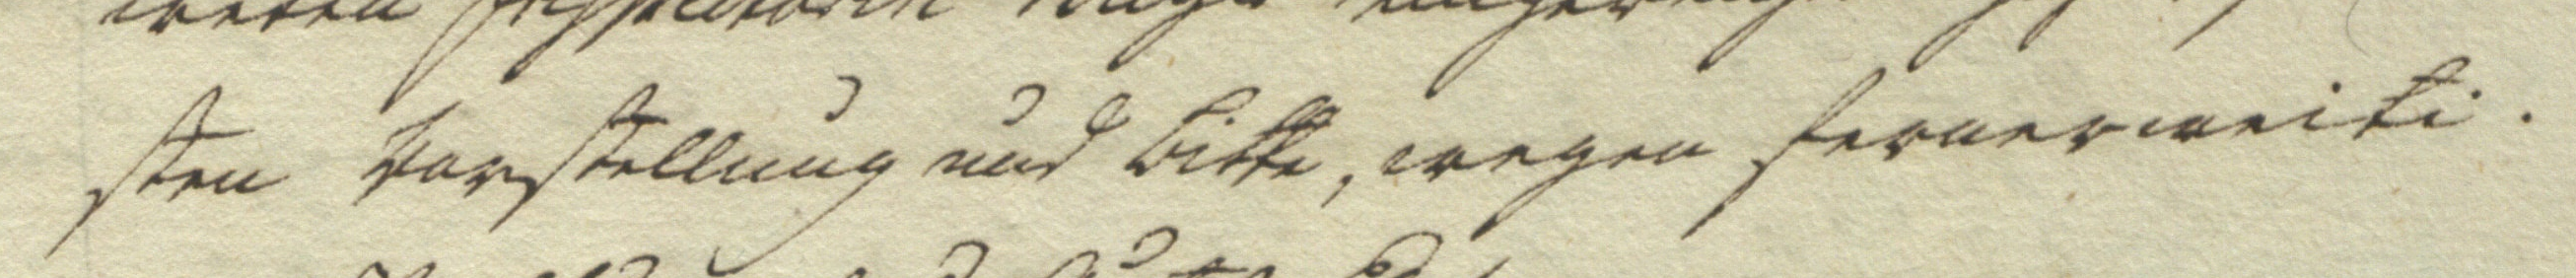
sten Vorstellung und Bitte, wegen fernerweiti¬
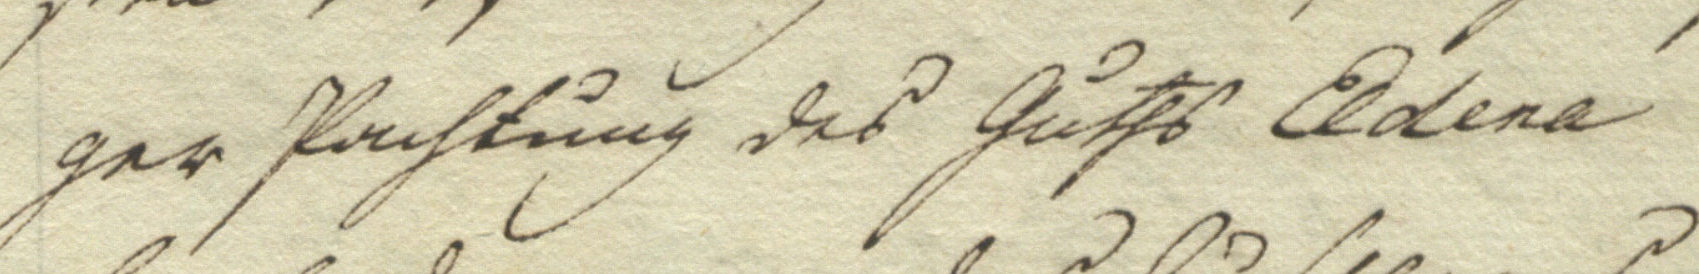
ger Pachtung des Guths Eldena
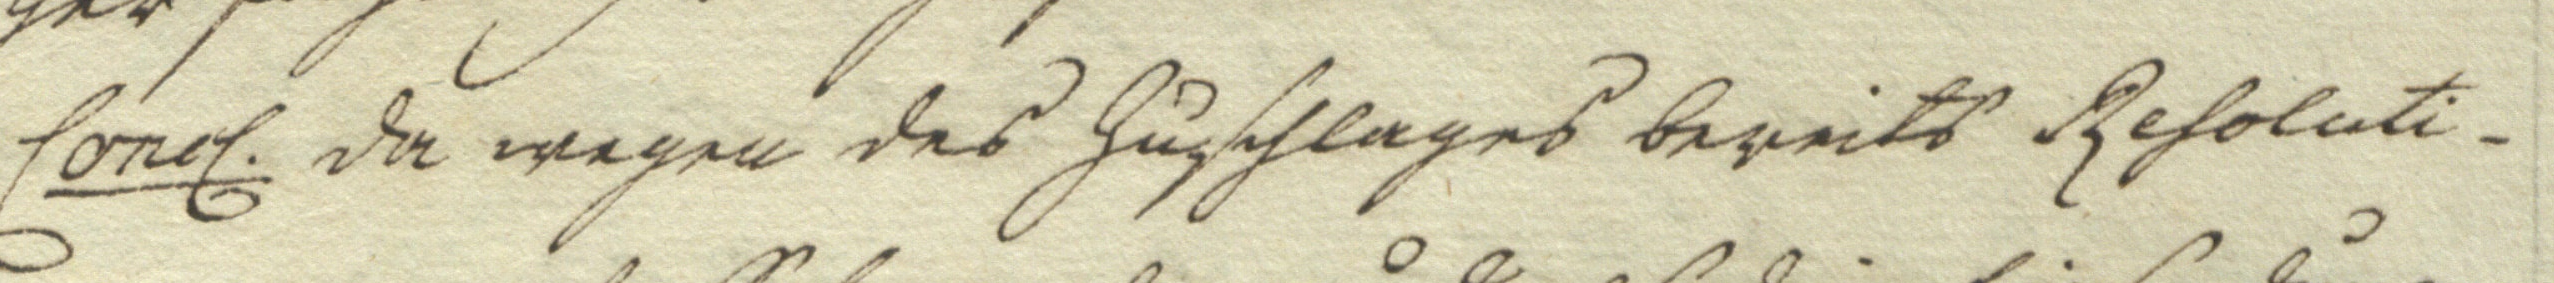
Concl. da wegen des Zuschlages bereits Resoluti¬
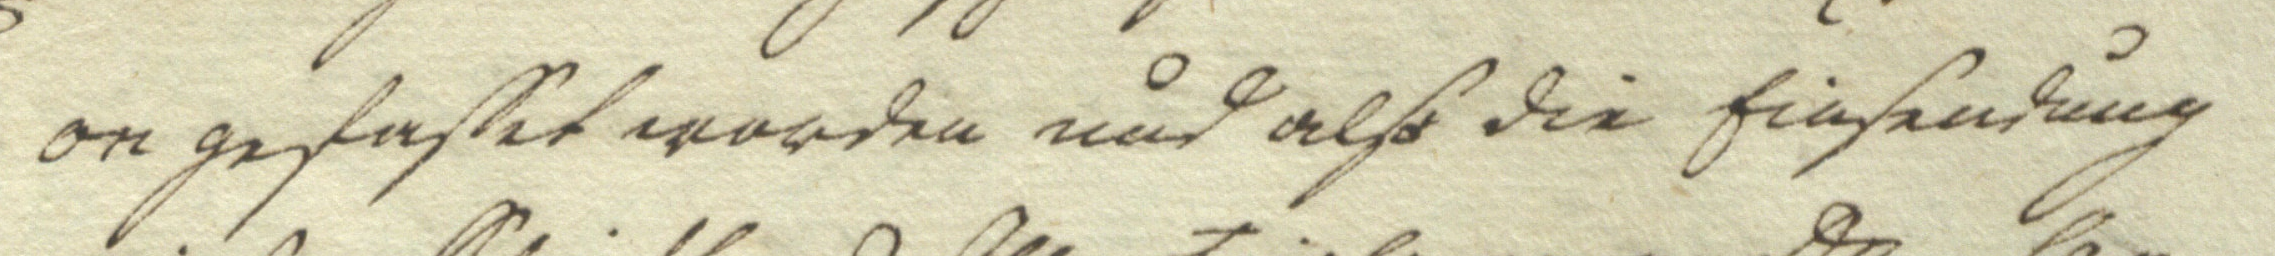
on gefasset worden und also die Einsendung
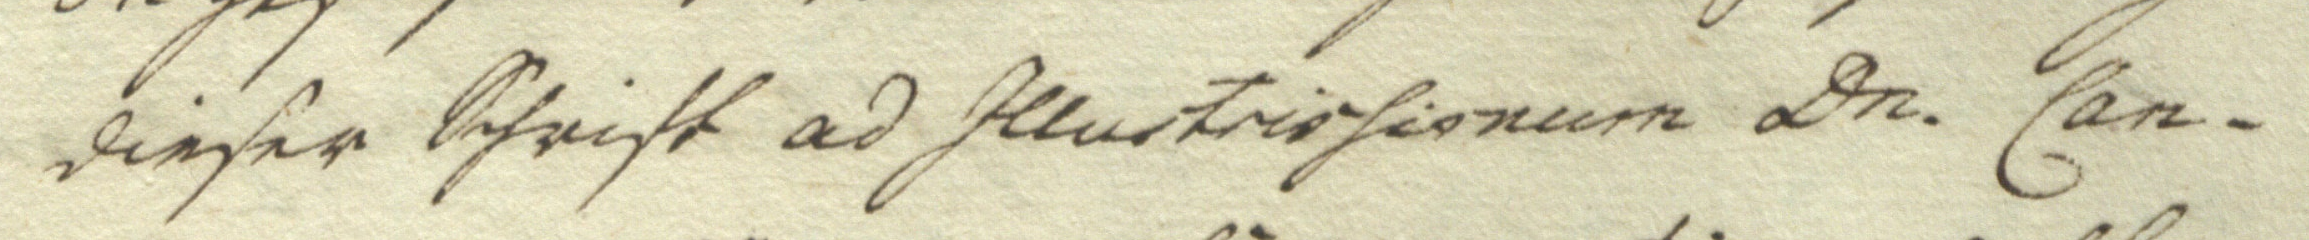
dieser Schrift ad Illustrissimum Dn. Can¬
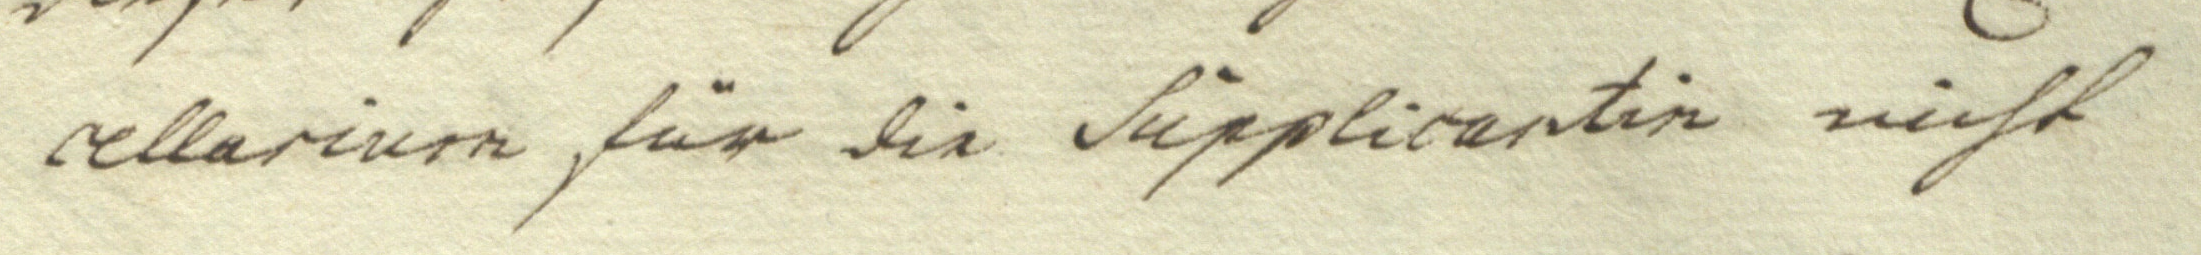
cellarium für die Supplicantin nicht
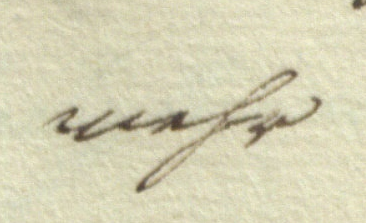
mehr
